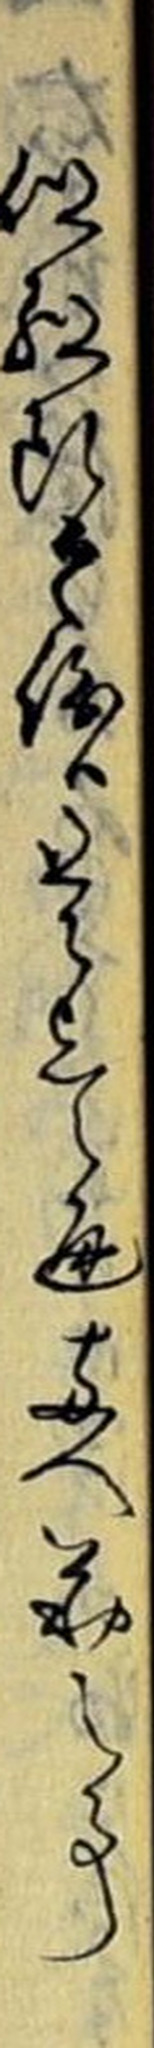但組頭之儀は是迄之通両人勤之事
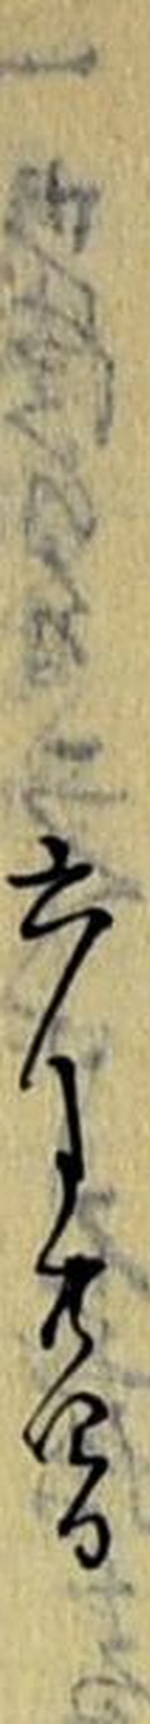六月廿四日
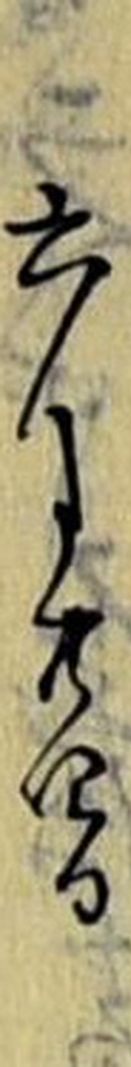六月廿四日
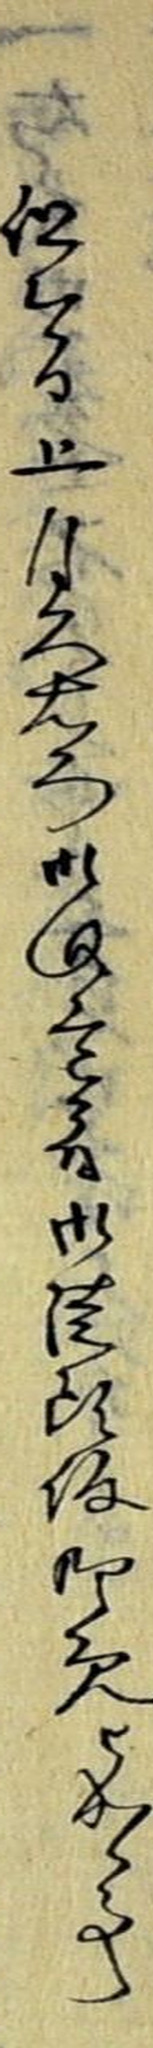但今日上月久右衛門御趣意に付御徒頭仮御免被成候事
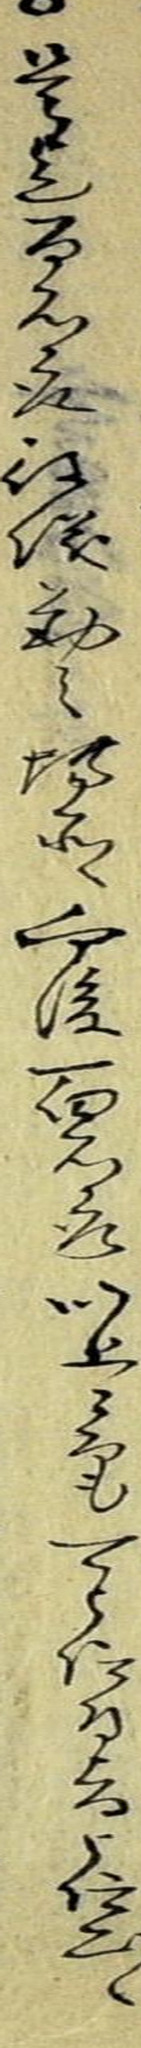○是迄百石取役儀勤之場所へ向後百石取以上に而も可被仰付旨被仰出候
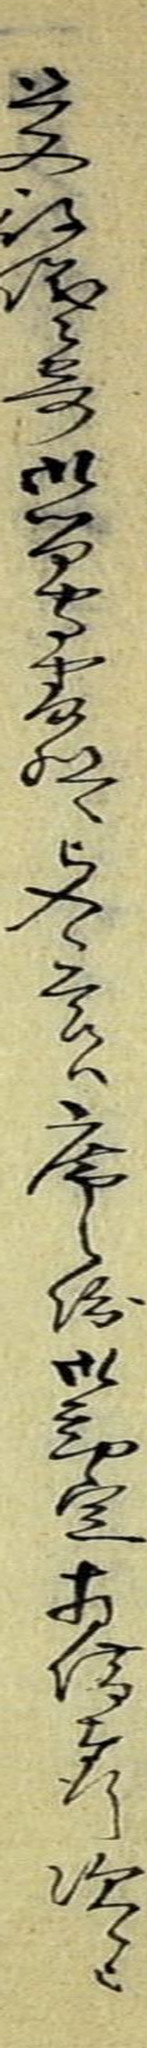且又役儀に寄御留守番組へ被入候節は席之儀御勘定拝借奉行次へ被
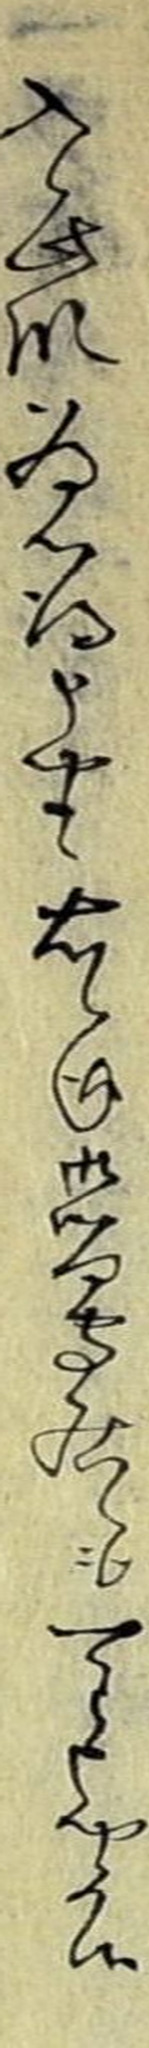入候此段為心得申聞候右之趣御留守居へも可被申聞候
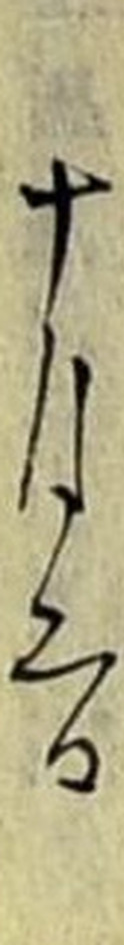十月二日
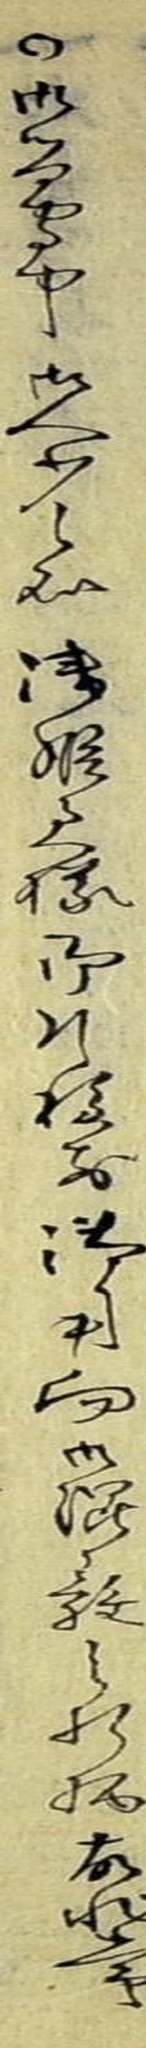○御留守中御人少之処淺姫君様御引移前御用向御混雑之折柄故非常
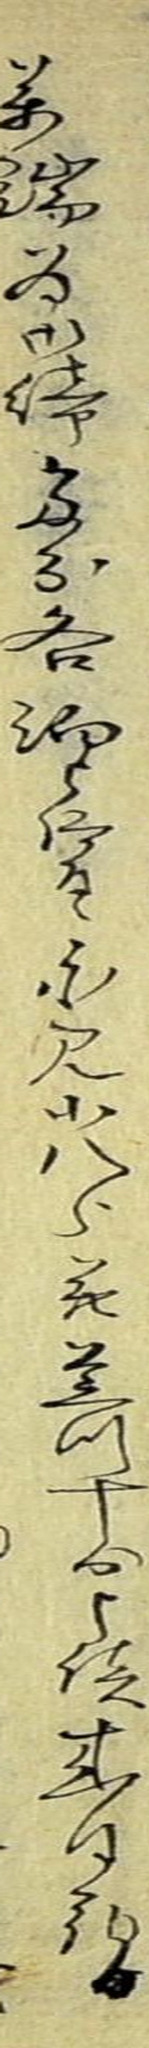萬端為御締多分各泊被仰付候永見小八郎并並川十右衛門申談来月朔日
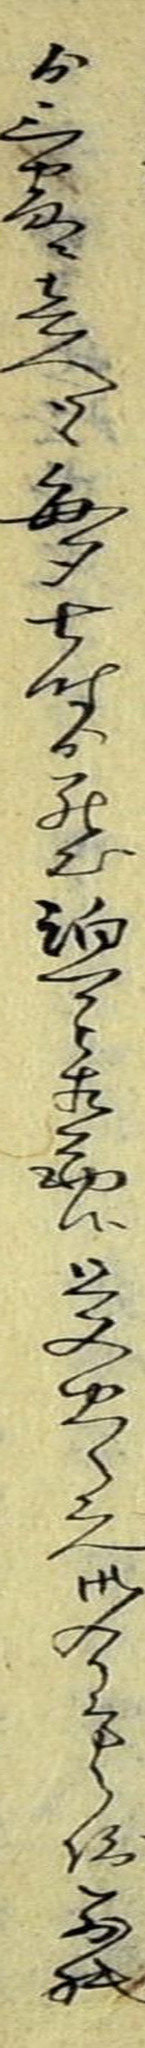ゟ三番へ壱人つヽ毎夕七時ゟ罷出泊可被相勤候且又火之元御〆り方之儀別紙
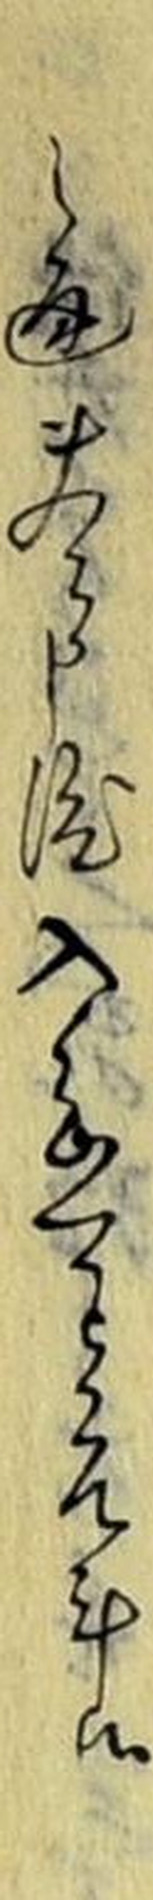之通夫々申渡入念可被取斗候

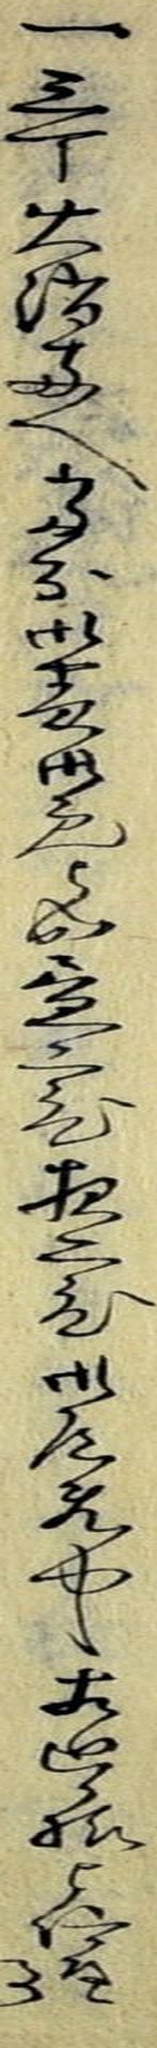一三丁火消両人当分御番御免被成昼二度夜二度御屋敷中相廻候様被仰付候事
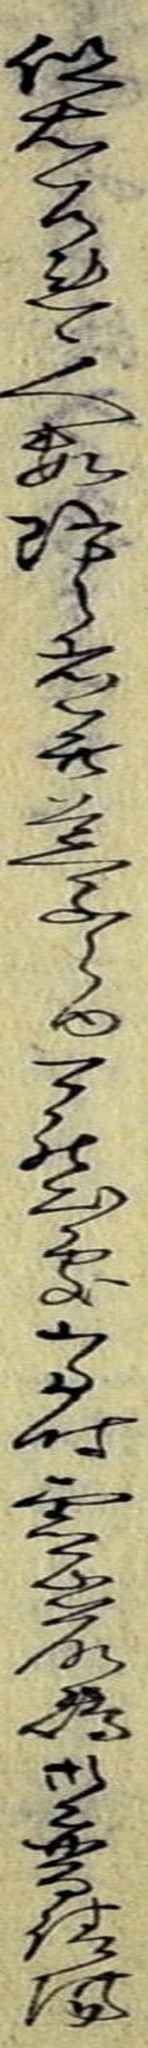但右召連候人数防之者共荒子之内可罷出処当時霊厳嶋御普請場
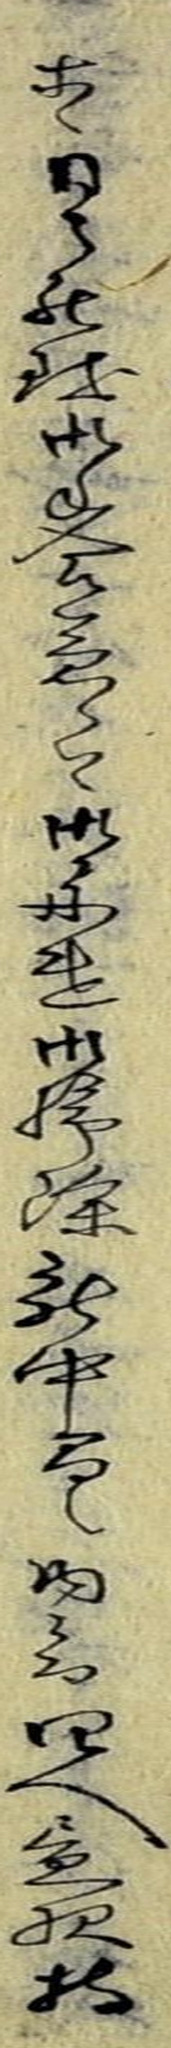等へ日々罷越御手合兼候はヽ御舟遣御掃除新中間之内に而四人昼夜持
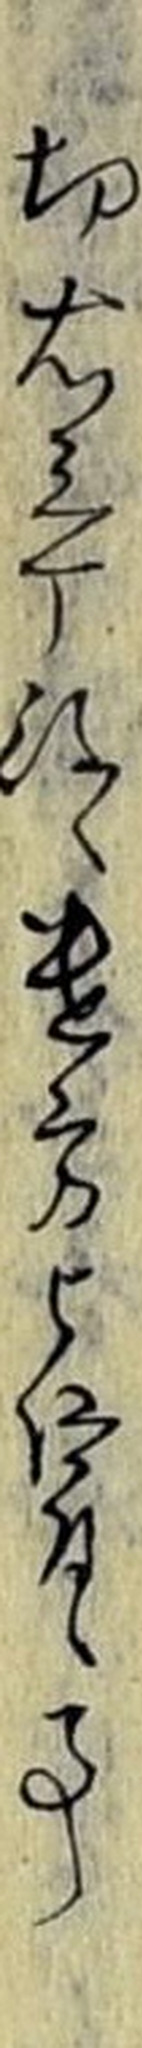切右三丁役へ遣方被仰付候事
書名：命令之部 四
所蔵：福井県文書館 Fukui Prefectural Archives
